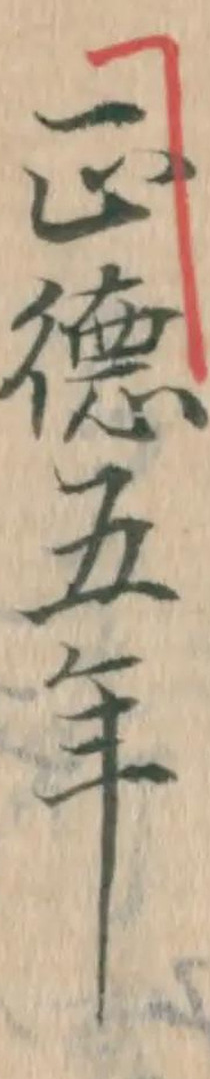正徳五年
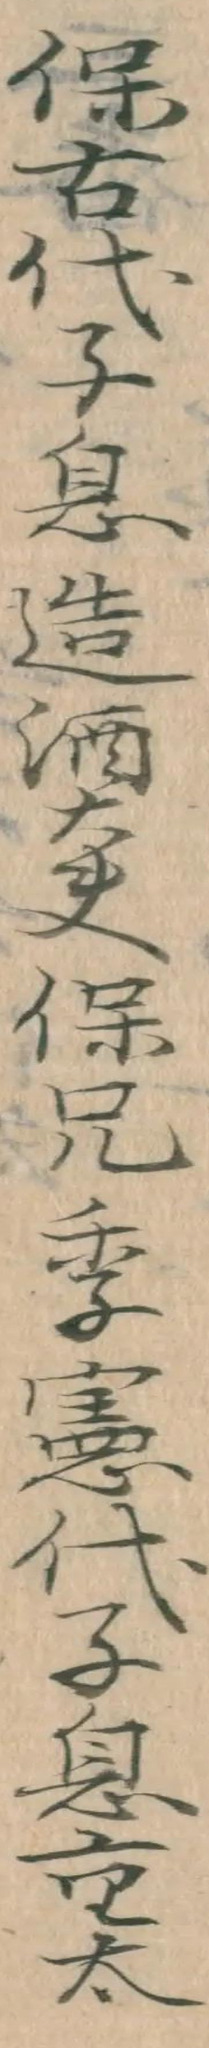保古代子息造酒大夫保兄季憲代子息重太
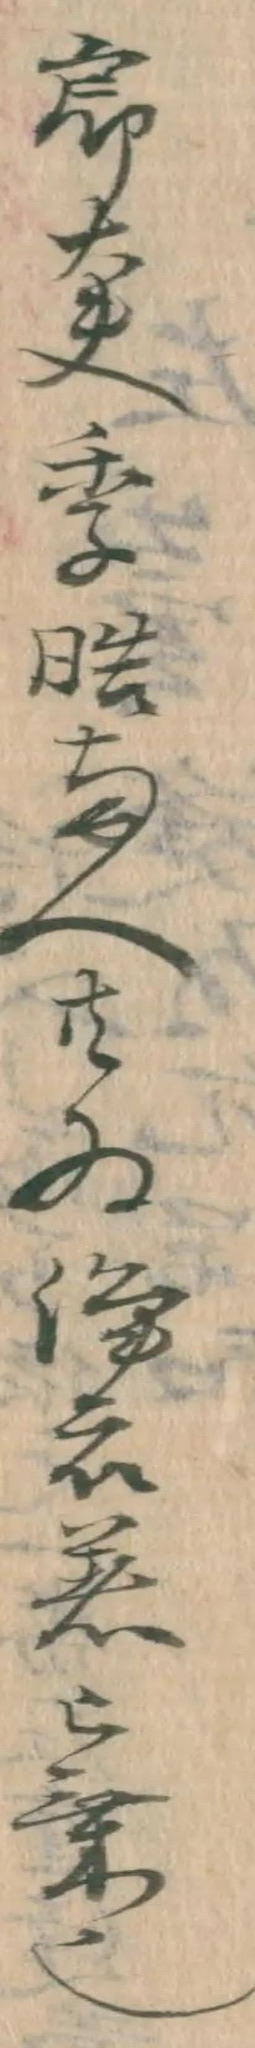郎大夫季晧両人共為浄衣着被乗也
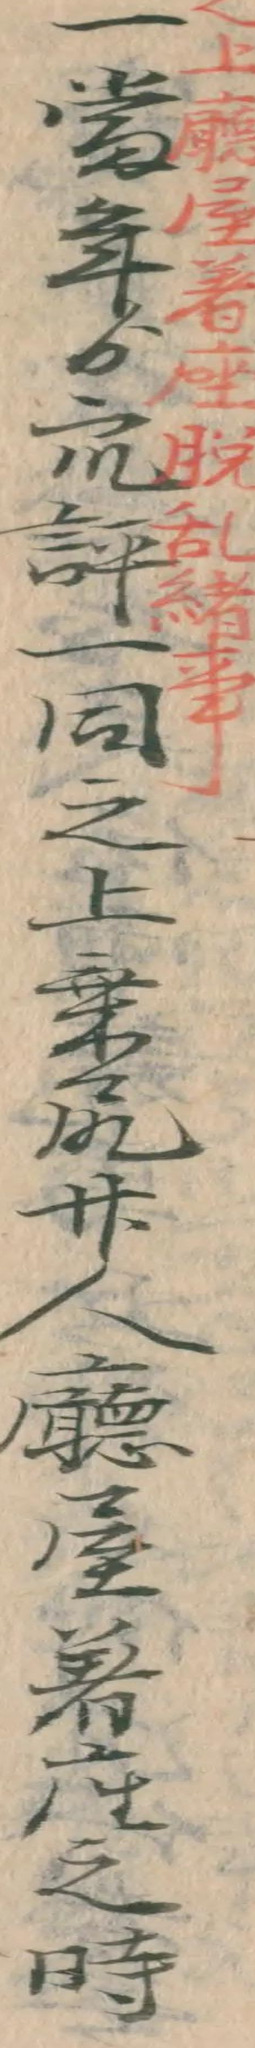一当年ゟ衆評一同之上乗尻廿人庁屋着座之時
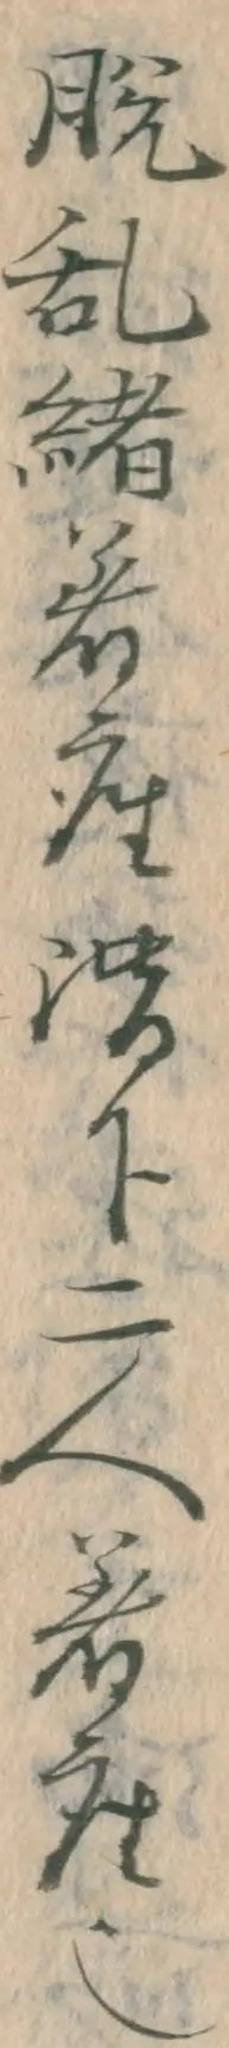脱乱緒着座階下二人着座也
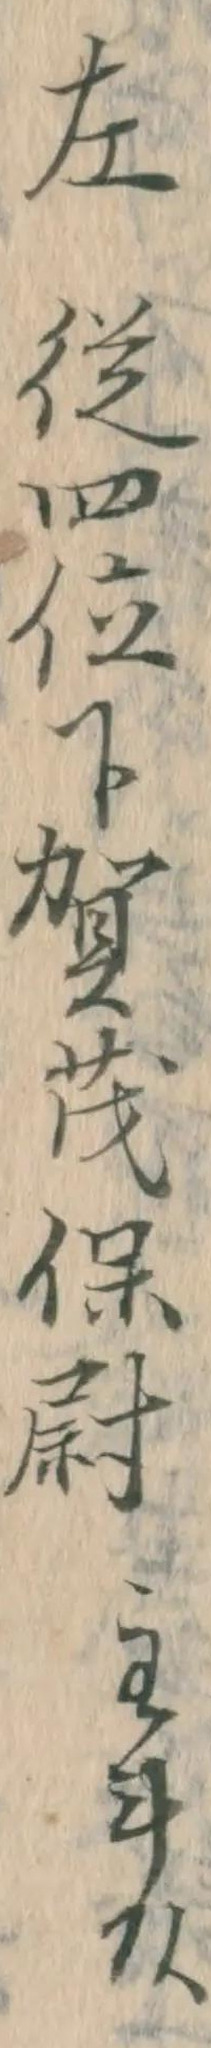左従四位下賀茂保尉主計頭
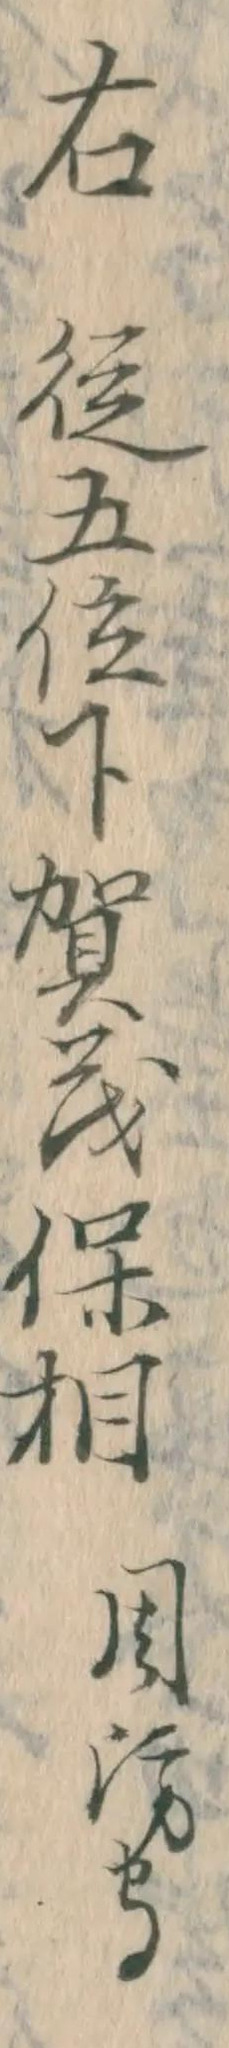右従五位下賀茂保相周防守
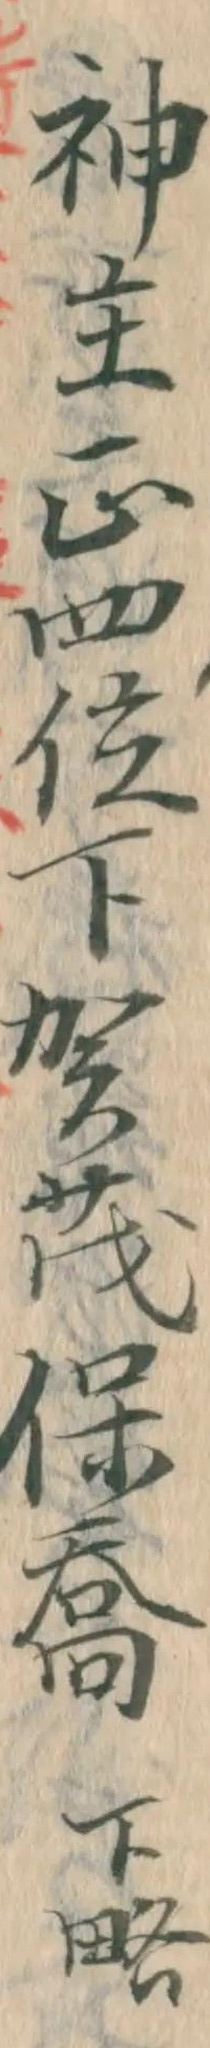神主正四位下賀茂保喬下略
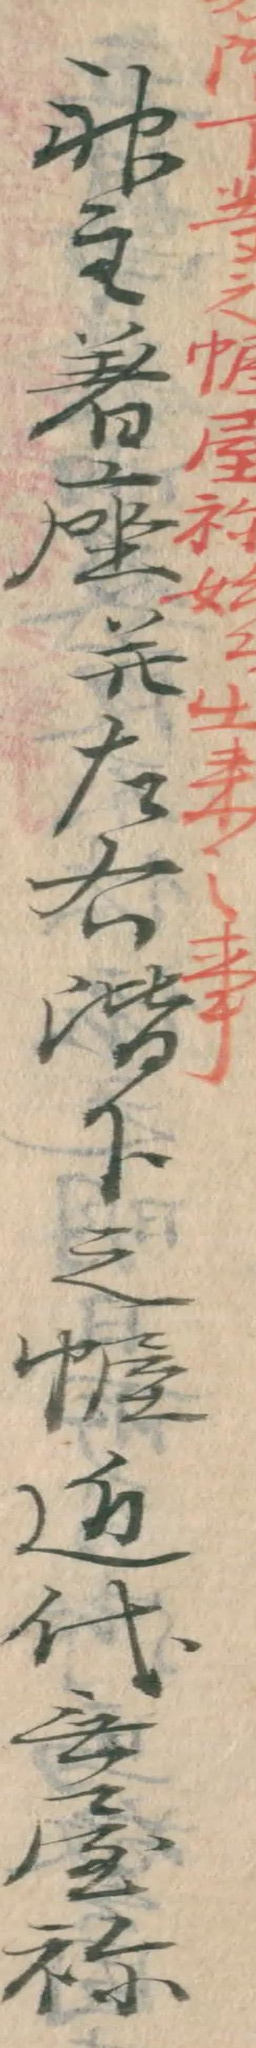一神主着座并左右階下之幄近代無屋祢
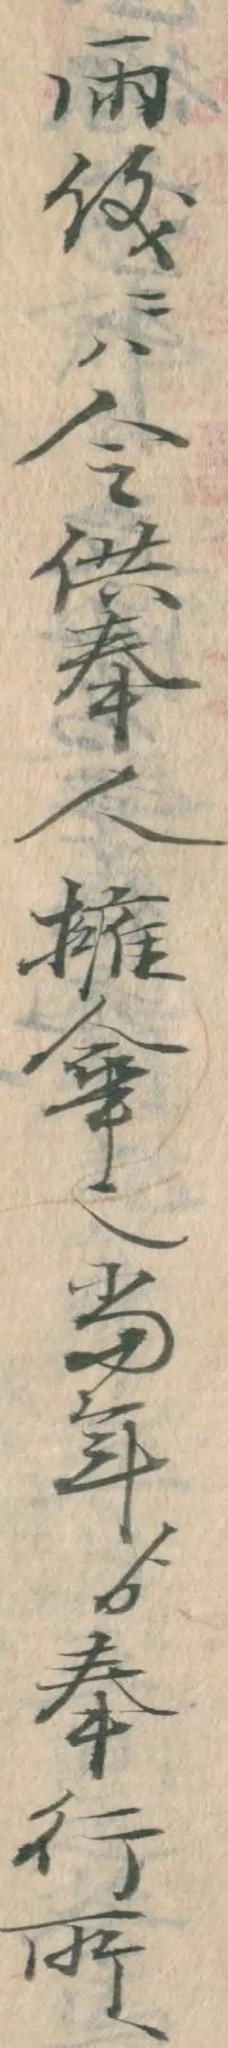両儀ニハ令供奉人擁傘也当年ゟ奉行所へ
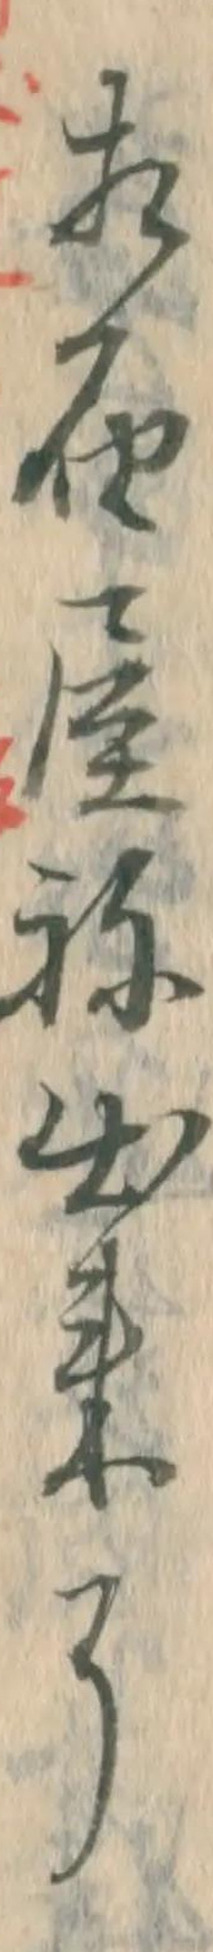相届屋祢出来了
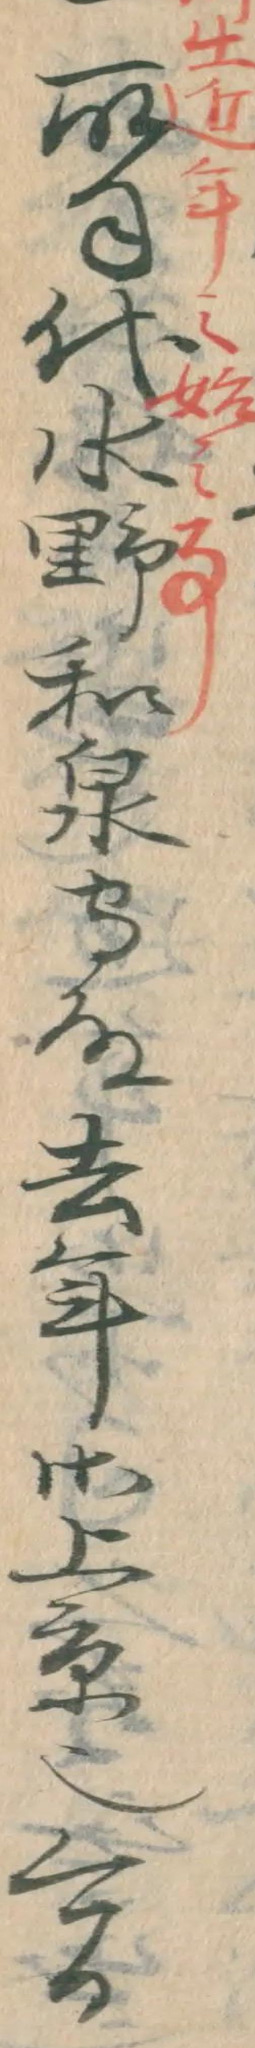一所司代水野和泉守殿去年御上京也今日

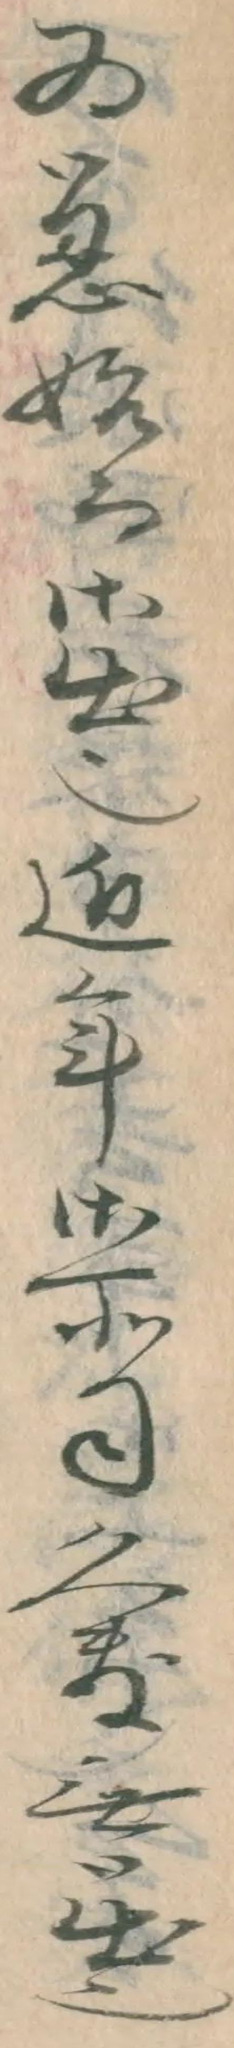為御忍始而御出也近年御所司久敷無御出之
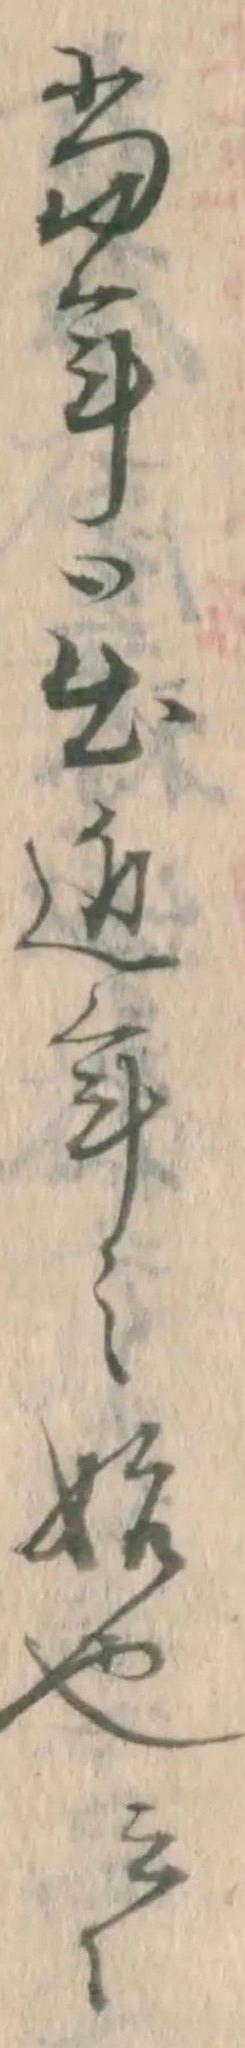当年御出近年之始也云々
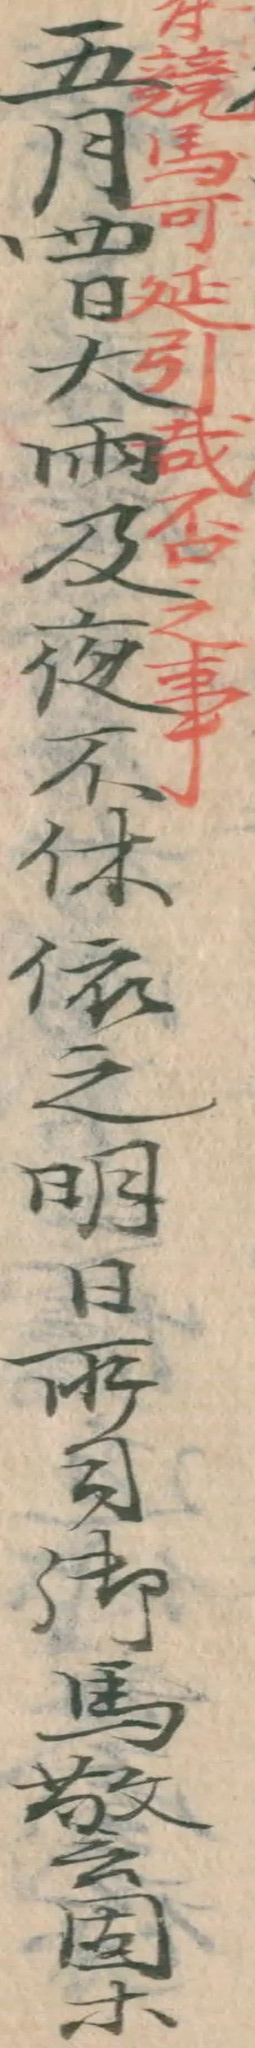五月四日大雨及夜不休依之明日所司御馬警固等
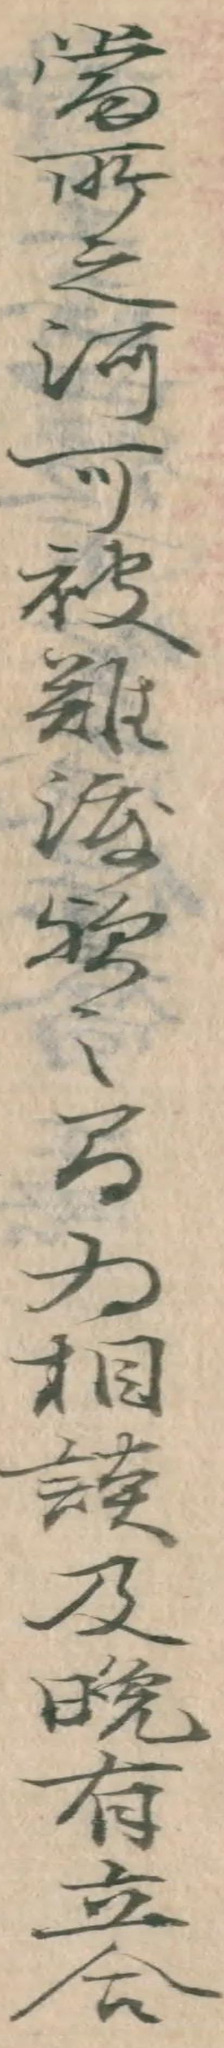当所之河可被難渡歟之間為相談及晩有立合
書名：賀茂社記録. 第10冊
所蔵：国立国会図書館 National Diet Library, JAPAN
